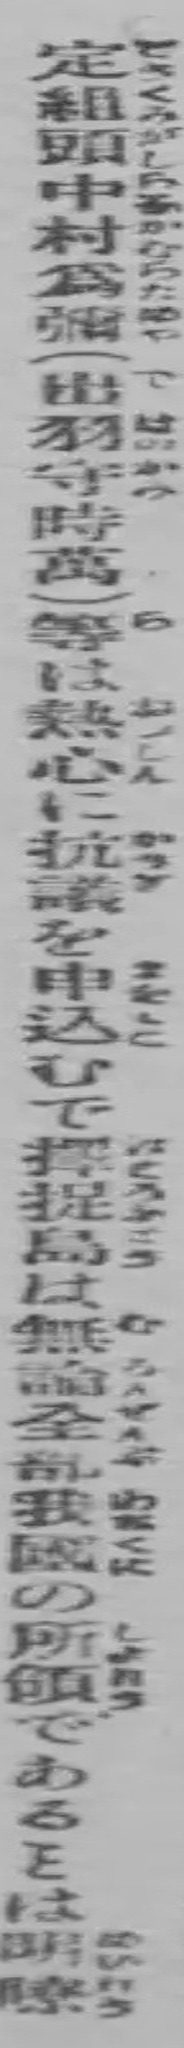定組頭中村為彌(出羽守時萬)等は熱心に抗議を申込むで択捉島は無論全部我国の所領であることは明瞭
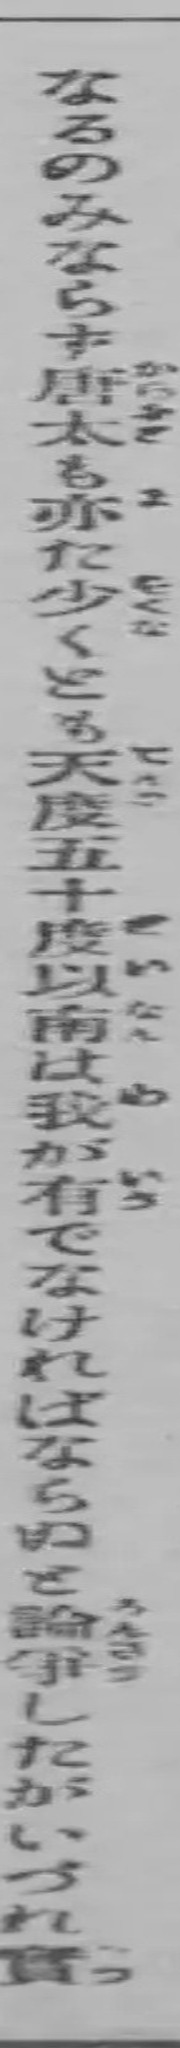なるのみならず唐太も亦た少くとも天度五十度以南は我が有でなければならぬと論争したがいづれ実
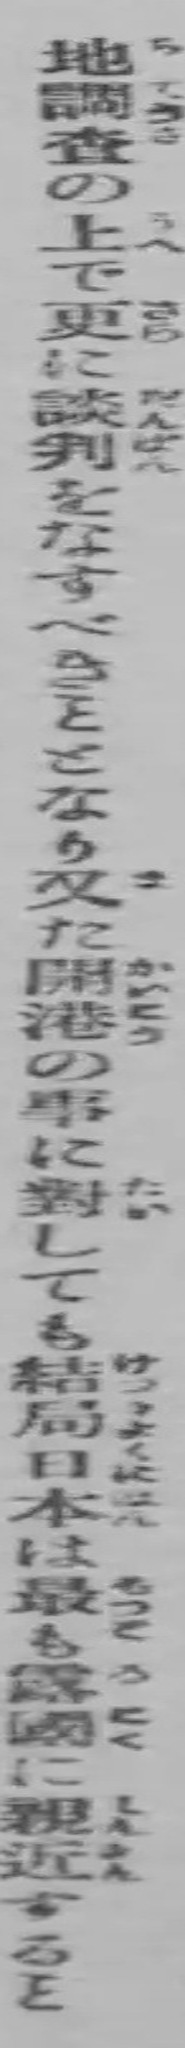地調査の上で更に談判をなすべきこととなり又た開港の事に対しても結局日本は最も露国に親近すること
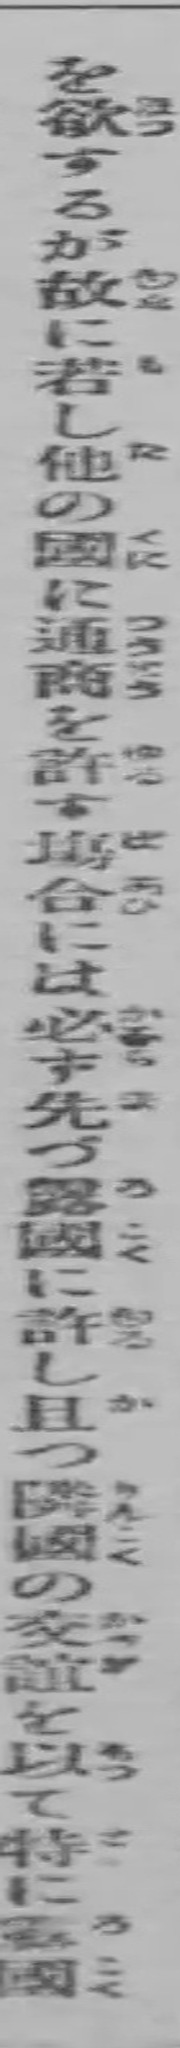を欲するが故に若し他の国に通商を許す場合には必ず先づ露国に許し且つ隣国の交誼を以て特に露国
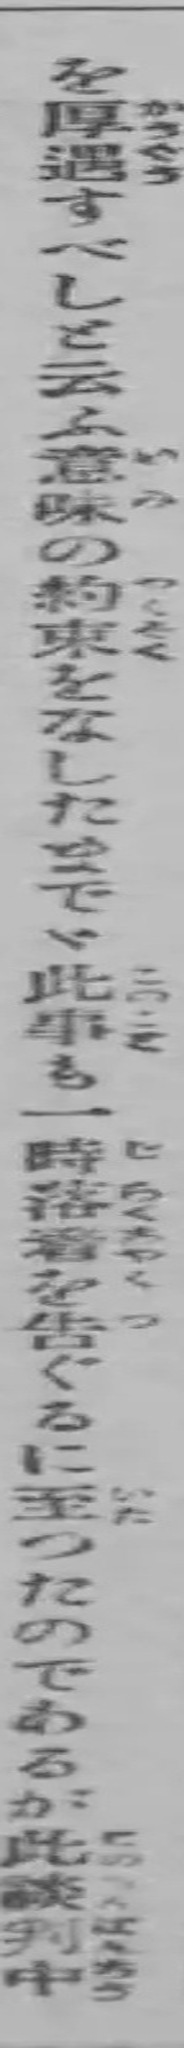を厚遇すべしと云ふ意味の約束をなしたまでゞ此事も一時落着を告ぐるに至つたのであるが此談判中
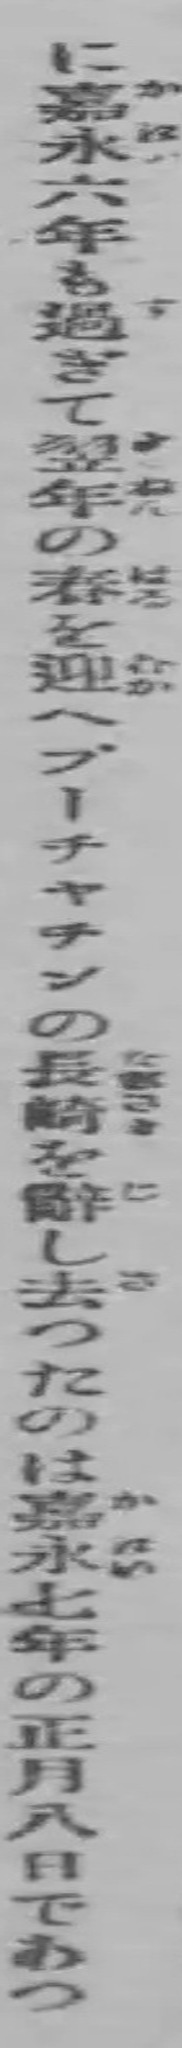に嘉永六年も過ぎて翌年の春を迎へプーチヤチンの長崎を辞し去つたのは嘉永七年の正月八日であつ
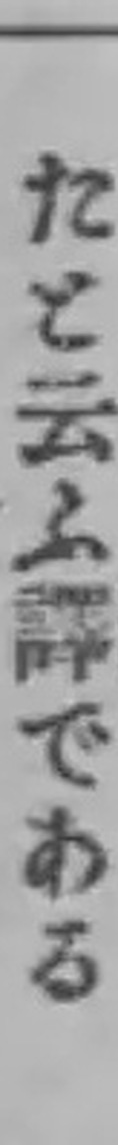たと云ふ訳である

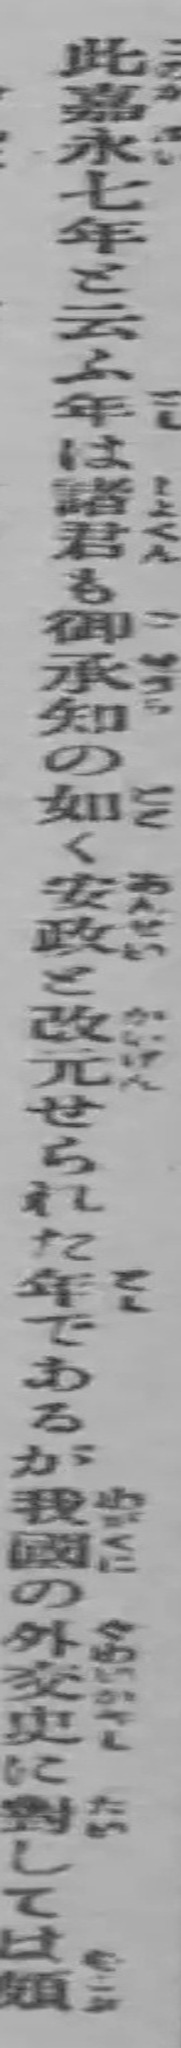此嘉永七年と云ふ年は諸君も御承知の如く安政と改元せられた年であるが我国の外交史に対しては頗
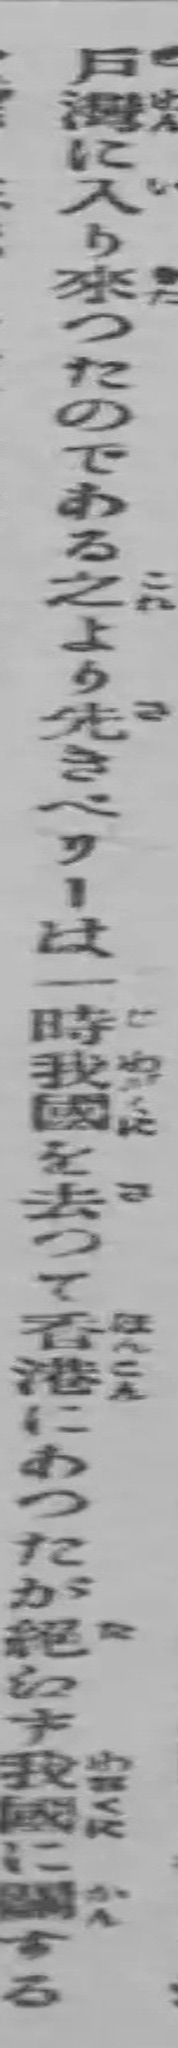戸湾に入り来つたのである之より先きペリーは一時我国を去つて香港にあつたが絶えず我国に関する
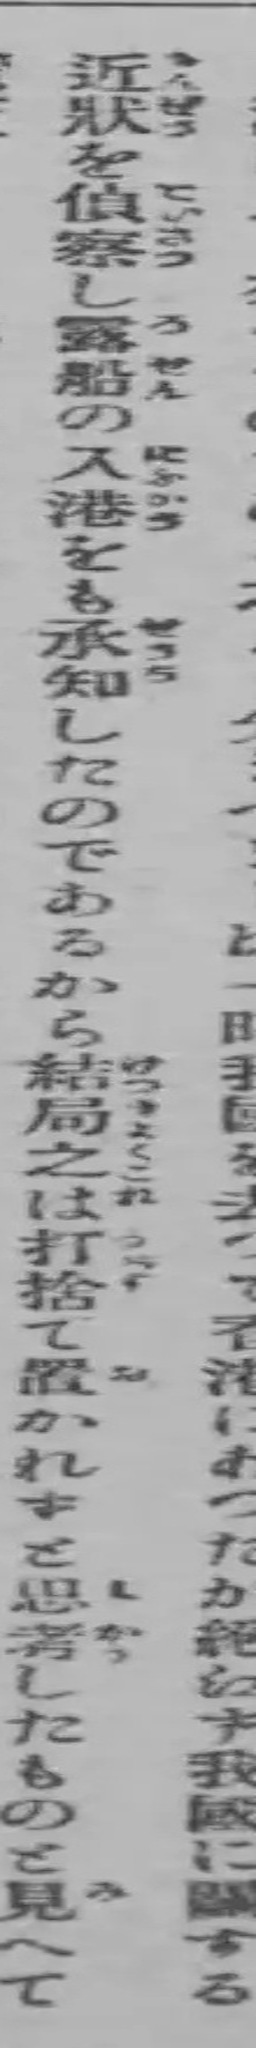近状を偵察し露船の入港をも承知したのであるから結局之は打捨て置かれずと思考したものと見へて
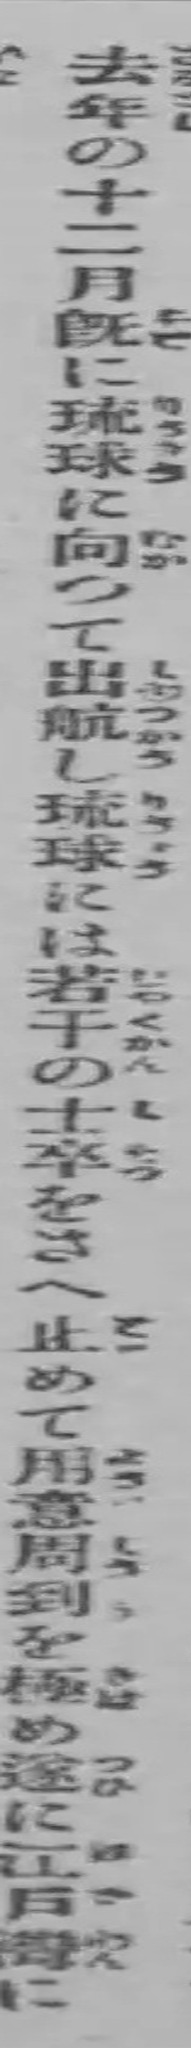去年の十二月既に琉球に向つて出航し琉球には若干の士卒をさへ止めて用意周到を極め遂に江戸湾に
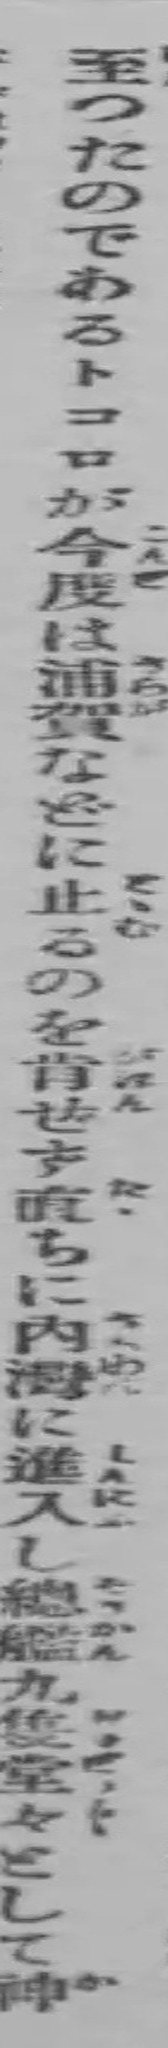至つたのであるトコロが今度は浦賀などに止るのを肯ぜず直ちに内湾に進入し総艦九隻堂々として神
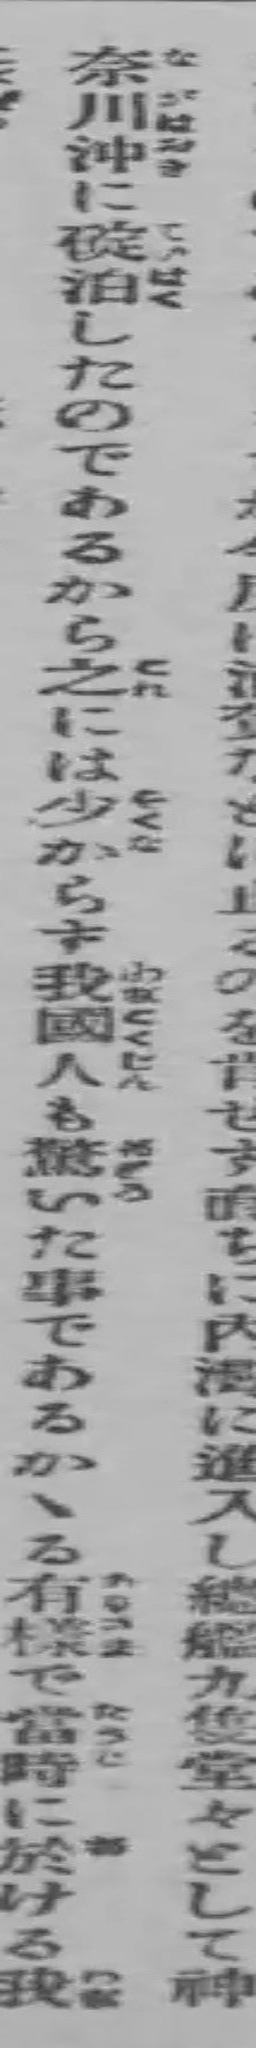奈川沖に碇泊したのであるから之には少からず我国人も驚いた事であるかゝる有様で当時に於ける我
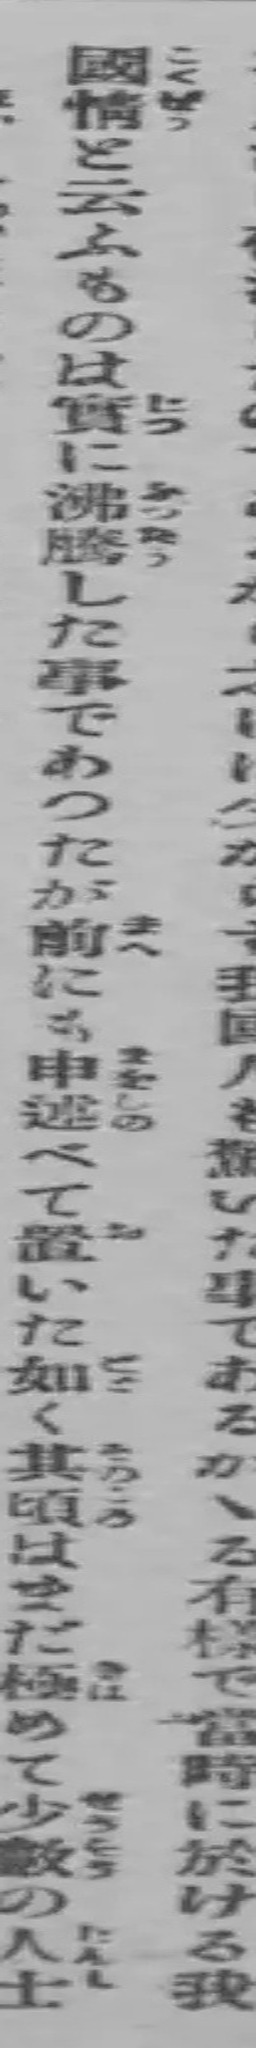国情と云ふものは実に沸騰した事であつたが前にも申述べて置いた如く其頃はまだ極めて少数の人士
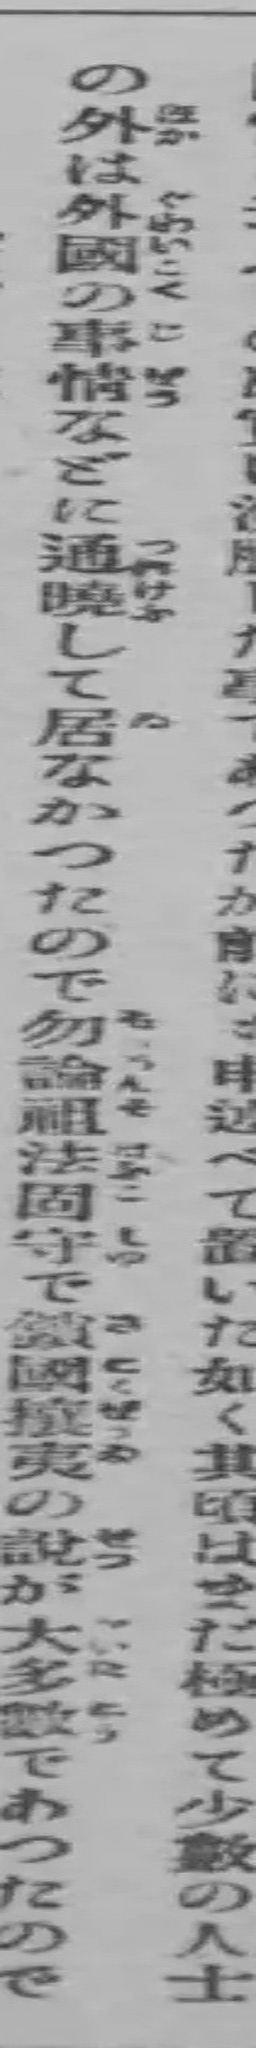の外は外国の事情などに通暁して居なかつたので勿論祖法固守で鎖国攘夷の説が大多数であつたので
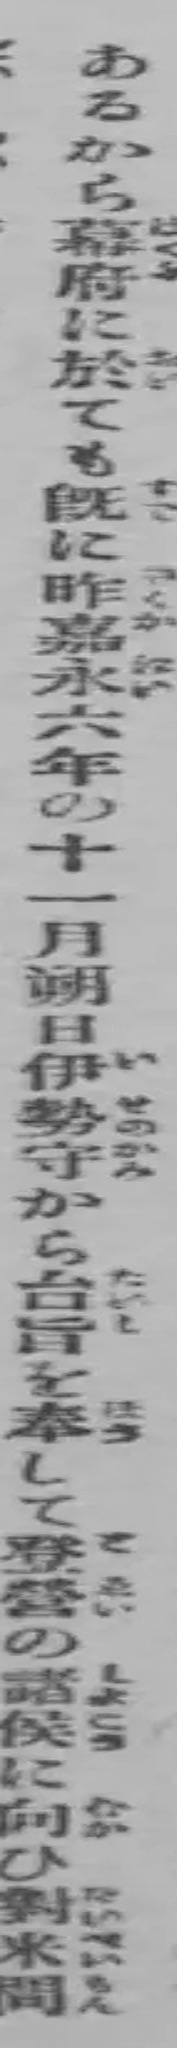あるから幕府に於ても既に昨嘉永六年の十一月朔日伊勢守から台旨を奉して登営の諸侯に向ひ対米問
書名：豊橋市史談
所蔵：国立国会図書館 National Diet Library, JAPAN
